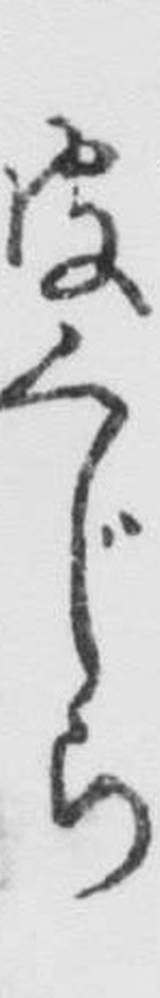皮くじら
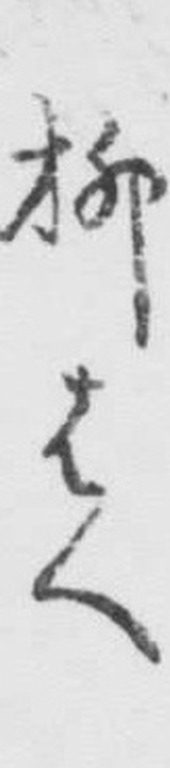柳はへ
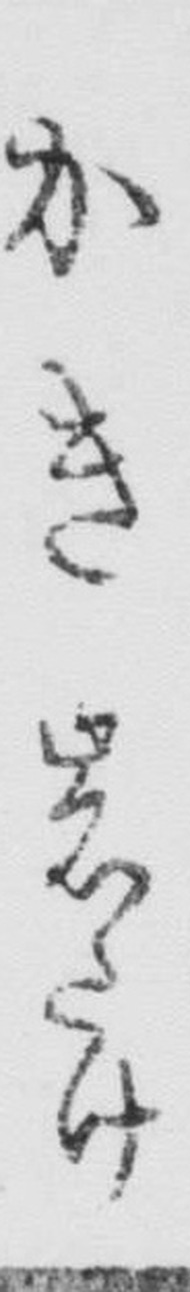かき岩たけ
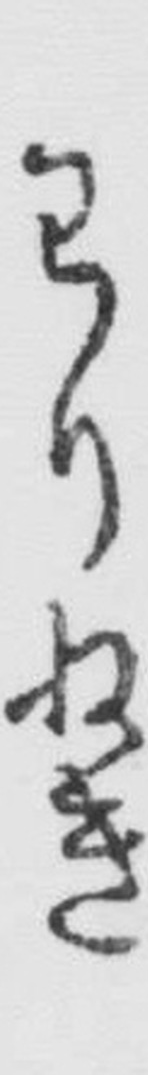わりねき
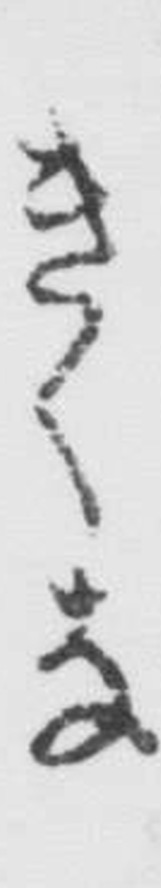きくな
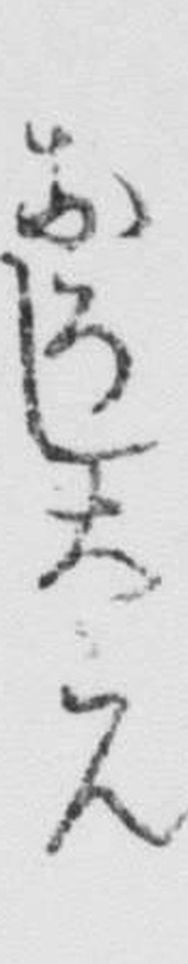おろし大こん
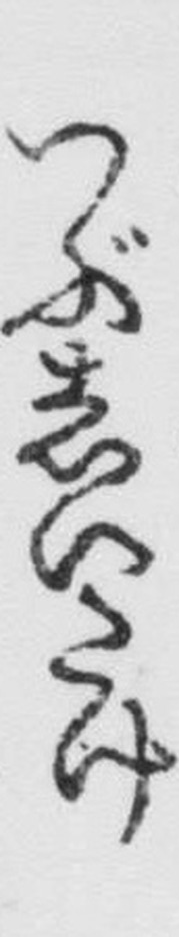つぶしいたけ
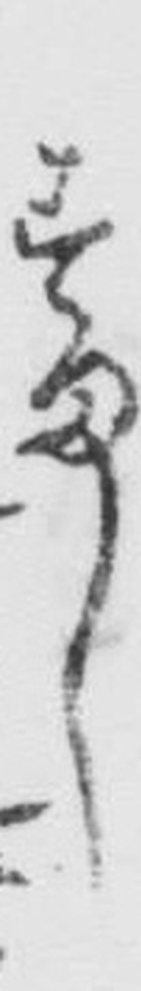すまし
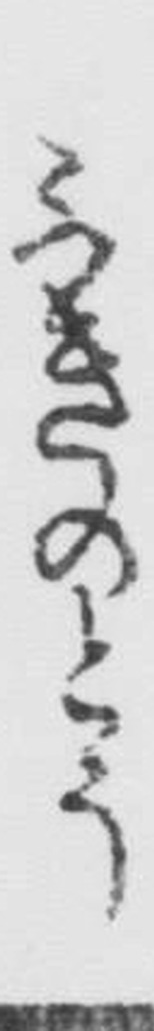ふきのとう
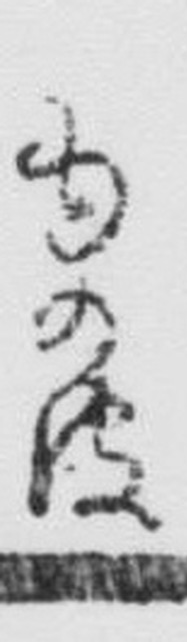ゆの皮
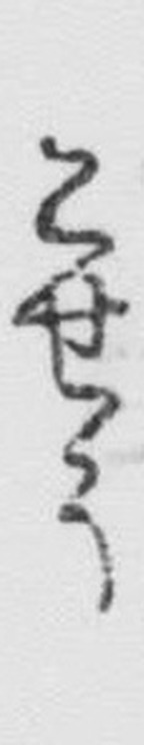こせう
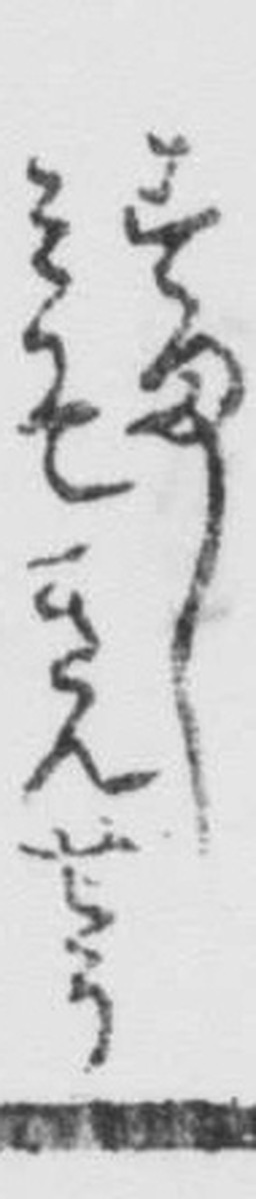みそさんせう
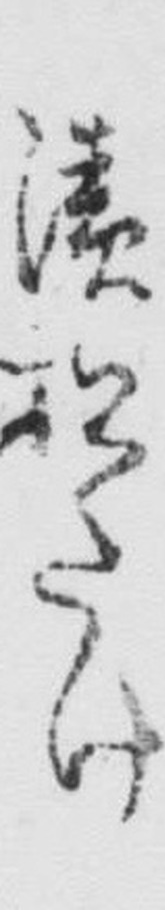漬松たけ
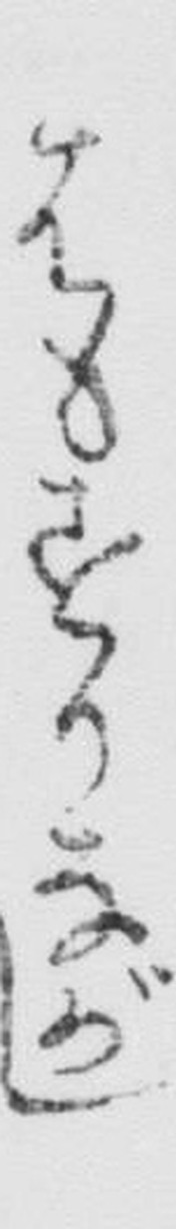はもすりながし
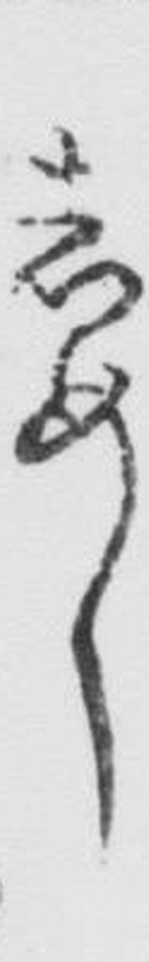しめし
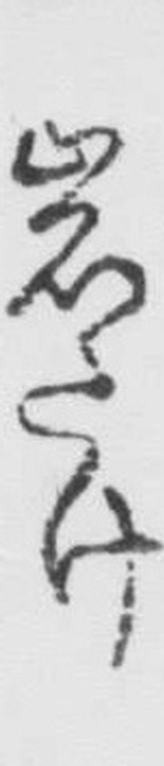岩たけ
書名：諸家通用/即席料理
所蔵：大阪府立大学学術情報センター 国文学研究資料館
